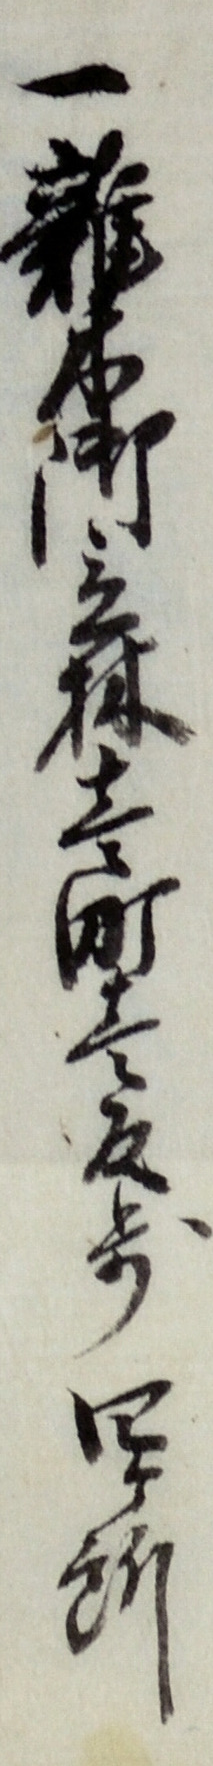一雑木御立林壱町壱反歩四ヶ所
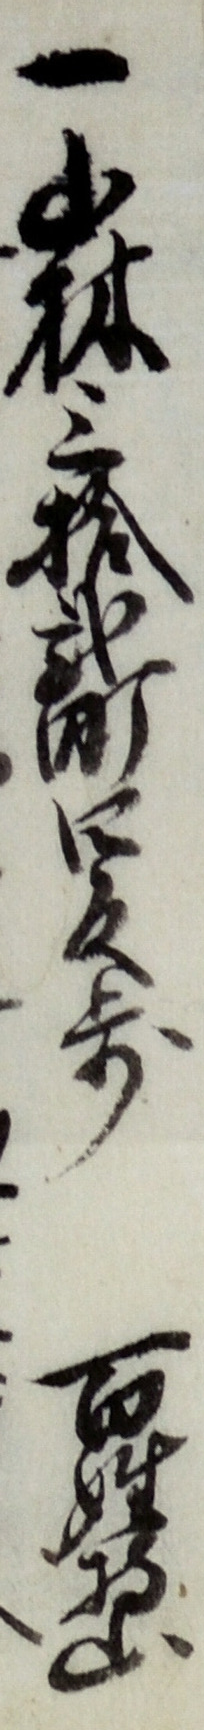一山林三拾弐町四反歩百姓持山
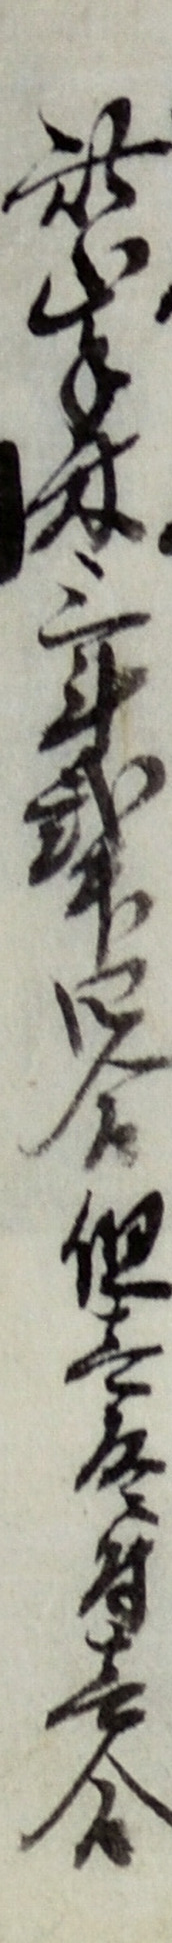此山手米三斗弐升四合但壱反ニ付壱合

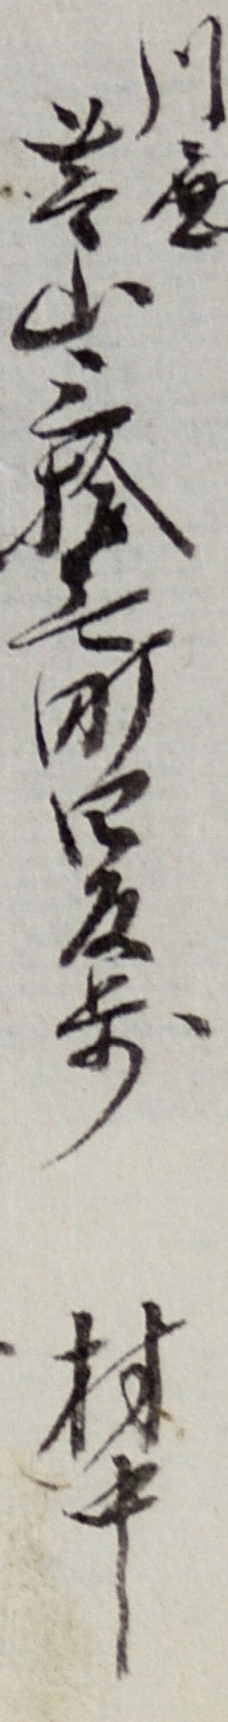芝山三拾壱町四反歩村中
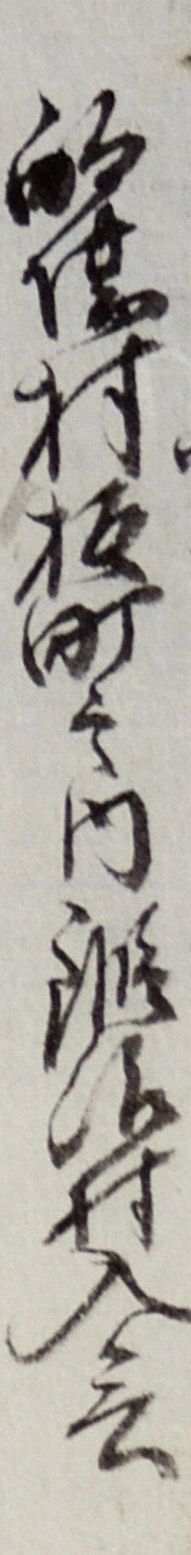的場村板町之内鍛冶村入会
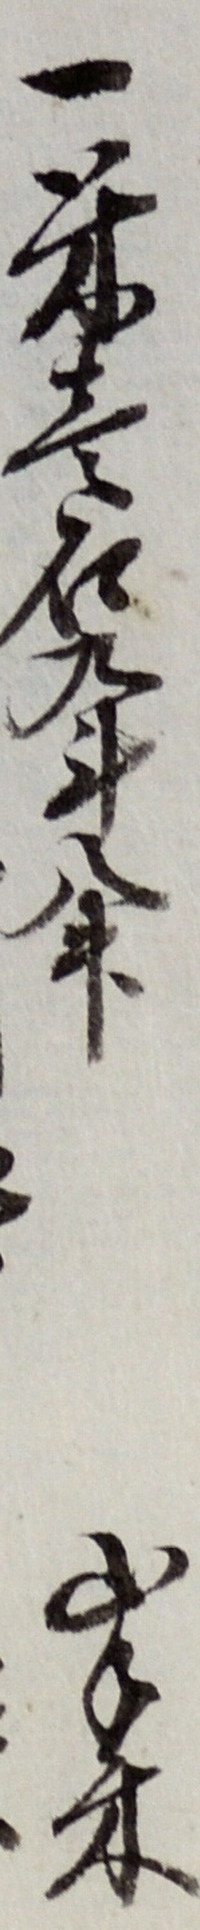一米壱石九斗八升山手米
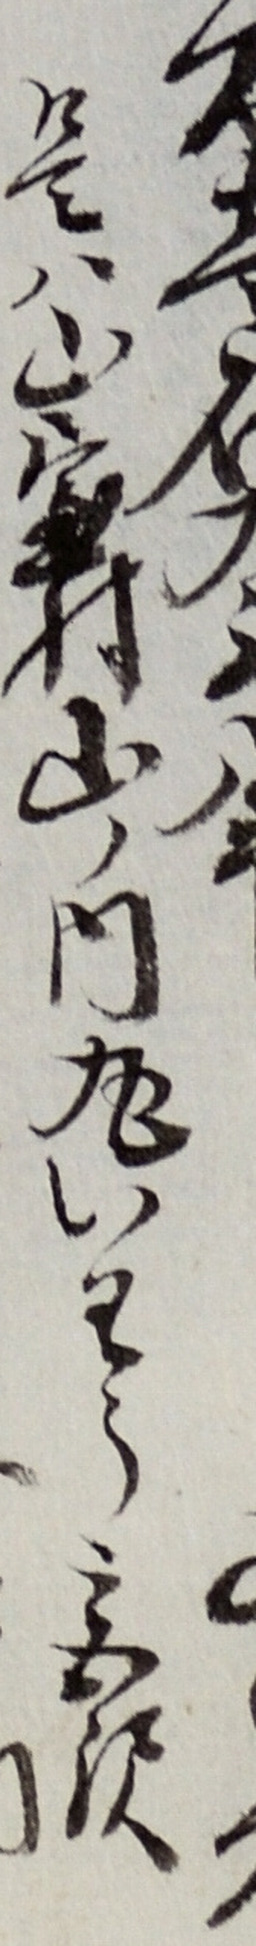是ハ山室村山ノ内丸いわう宮沢
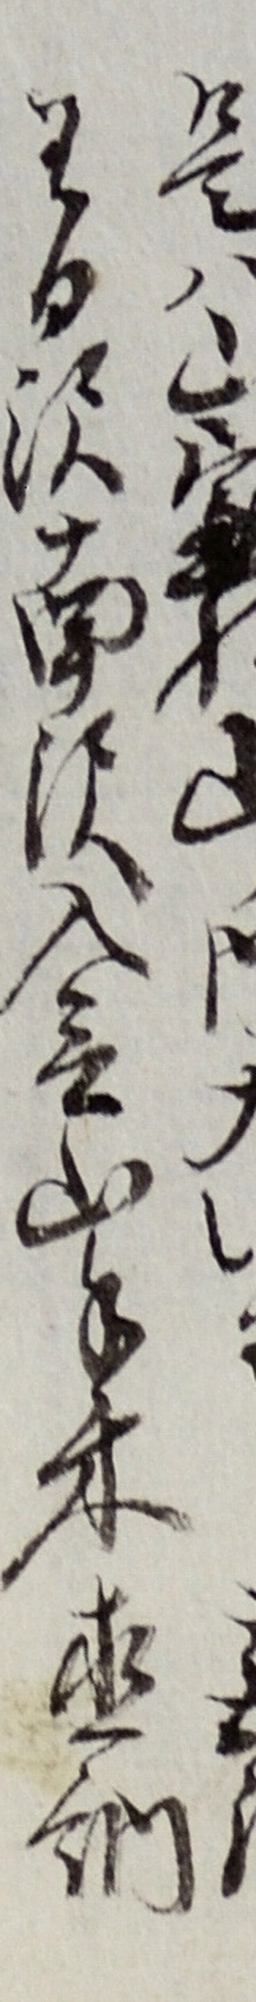わる沢南沢入会山手米直納
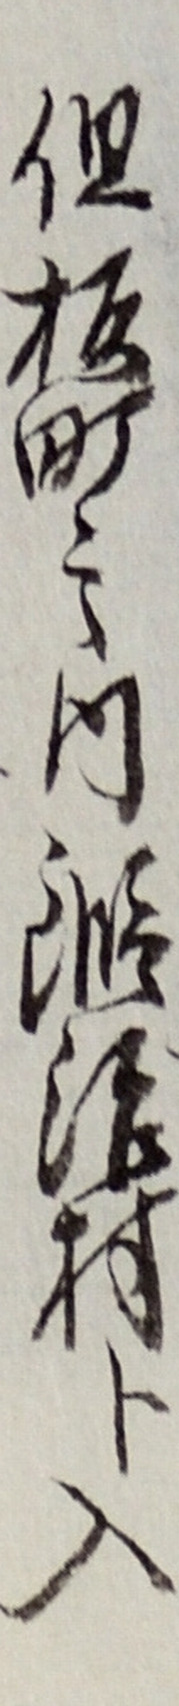但板町之内鍛冶村ト入
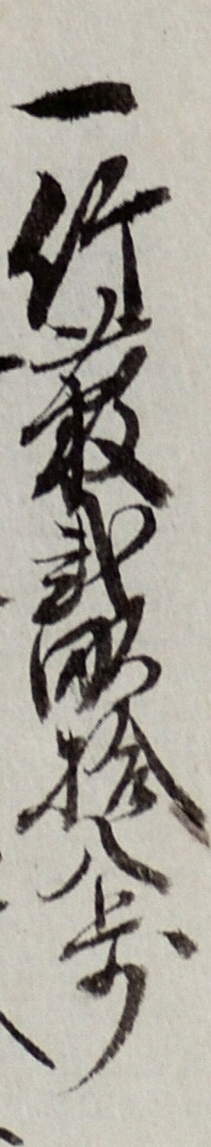一竹藪弐畝拾八歩
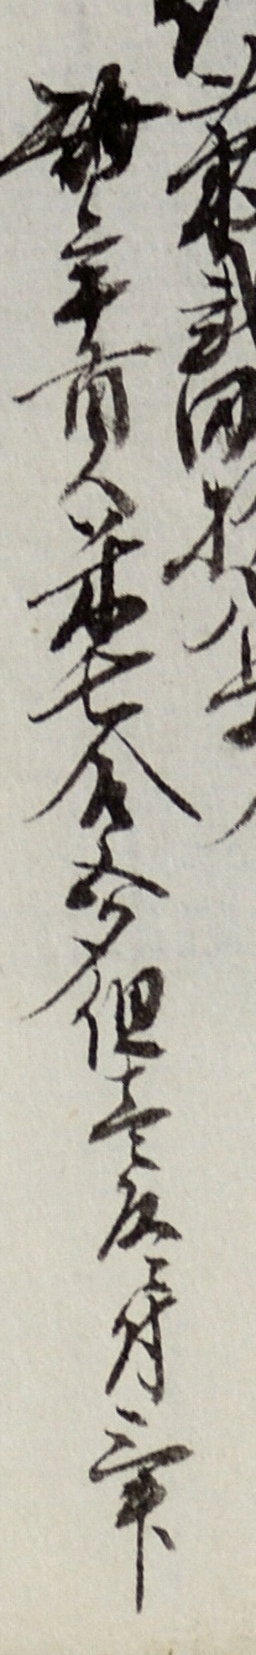此年貢米七合五勺但壱反ニ付三升
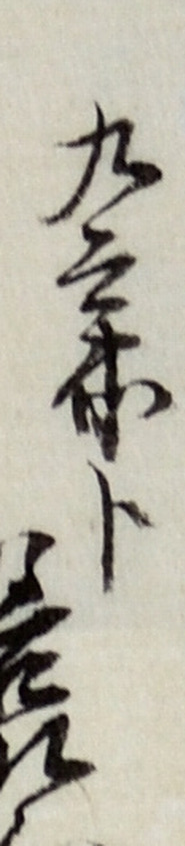九兵衛守之
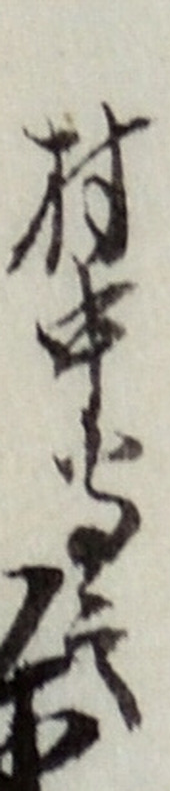村中守之
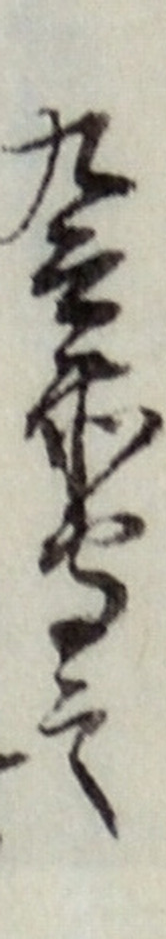九兵衛守之
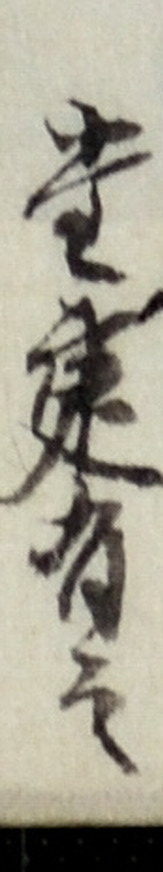堂建有之
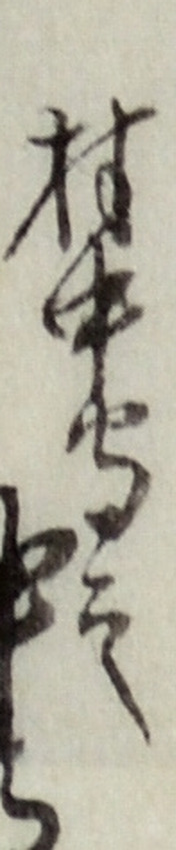村中守之
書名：御領分中山林社地手控
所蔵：伊那市立高遠町図書館・合同会社AMANE
